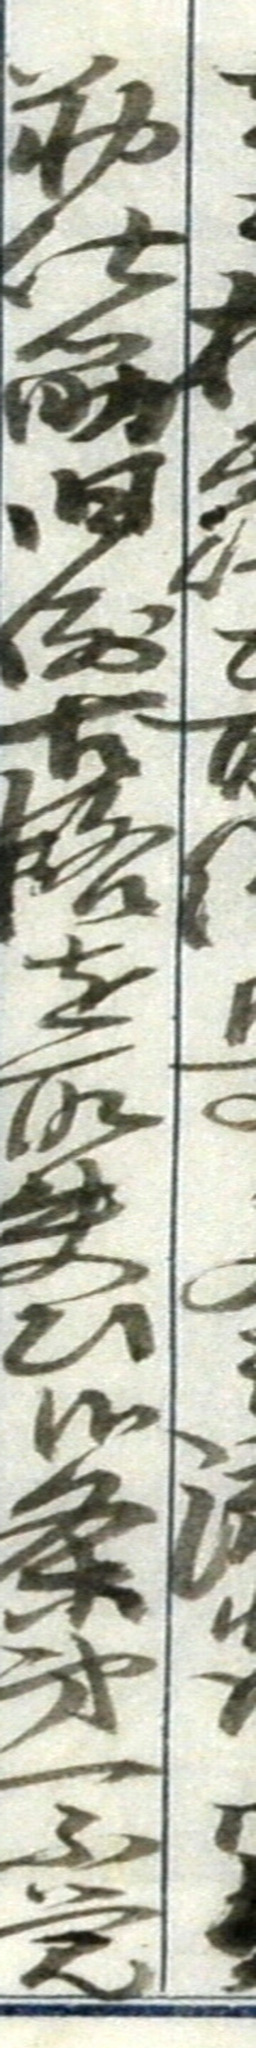勤仕筋旧例古格を取失ひ候条第一不覚
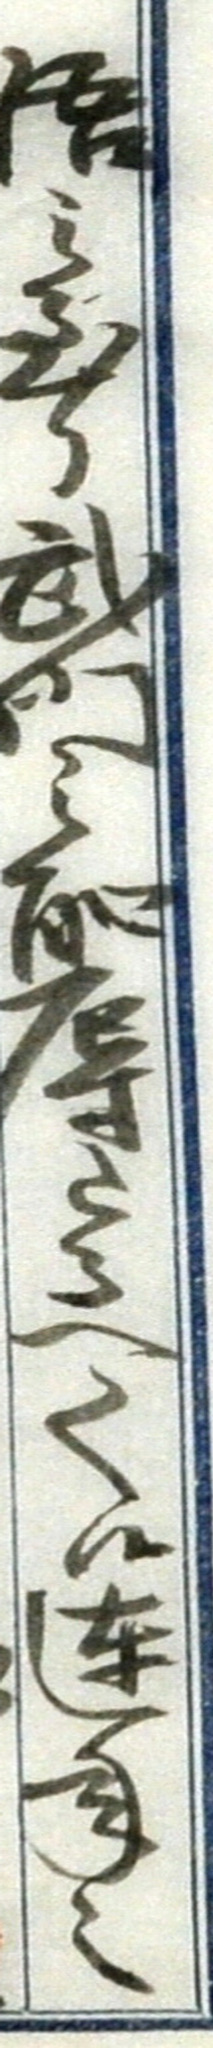悟之至り武門之恥辱たるへく候連年之
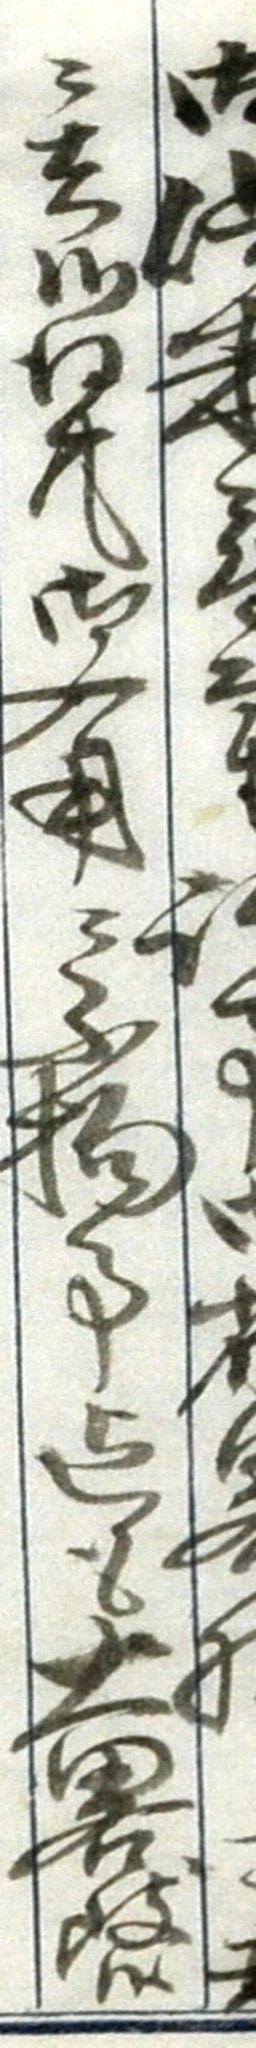ニは候得共御入用ニ不拘事迄も大略致候
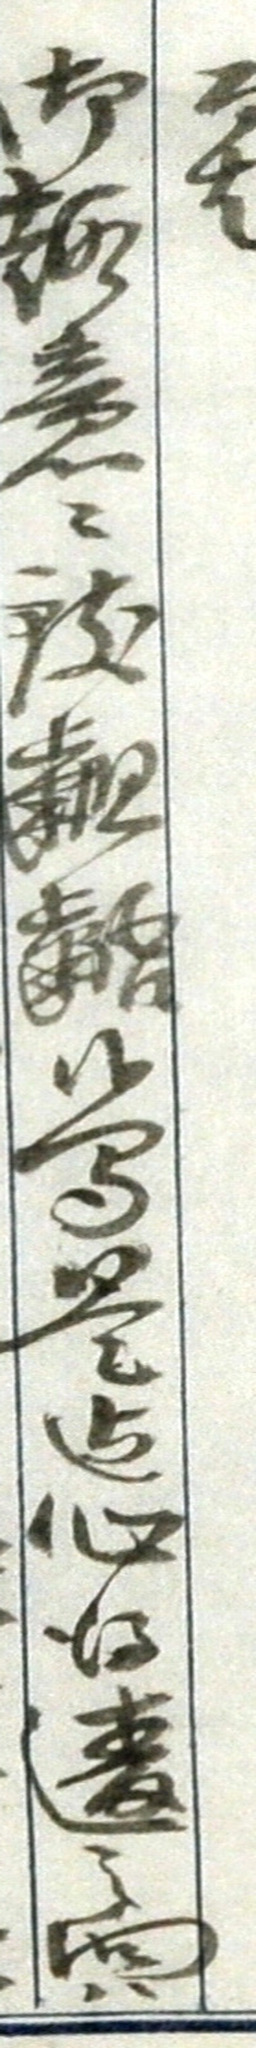御趣意ニ致齟齬候間是迄心得違之向ハ
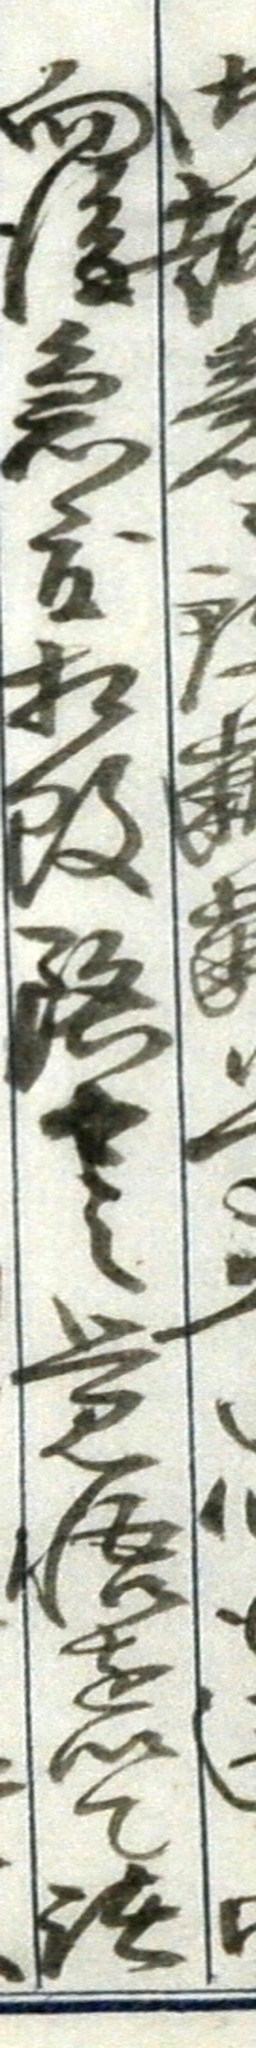向後急度相改銘々之覚悟を以て諸
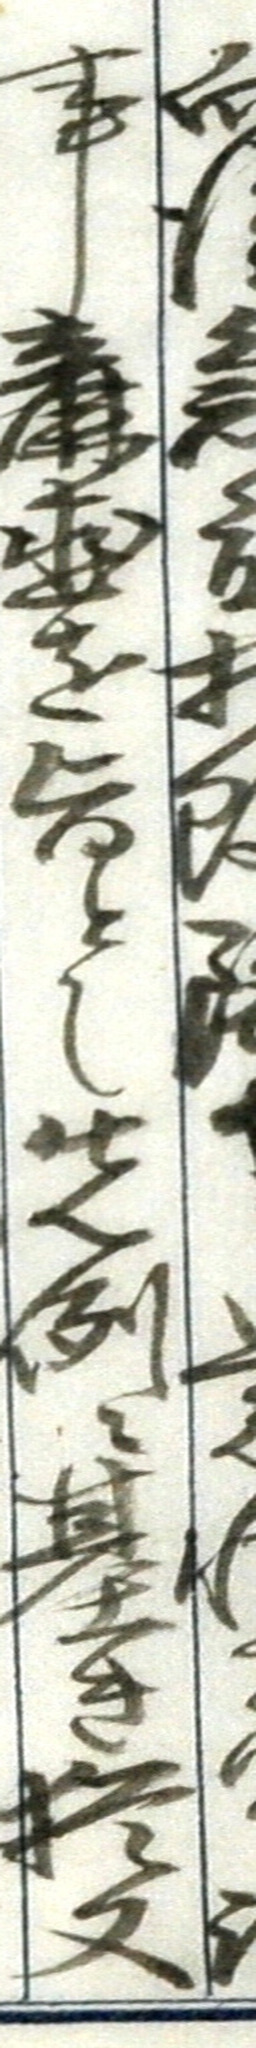事麁直を旨とし先例ニ基き猶又
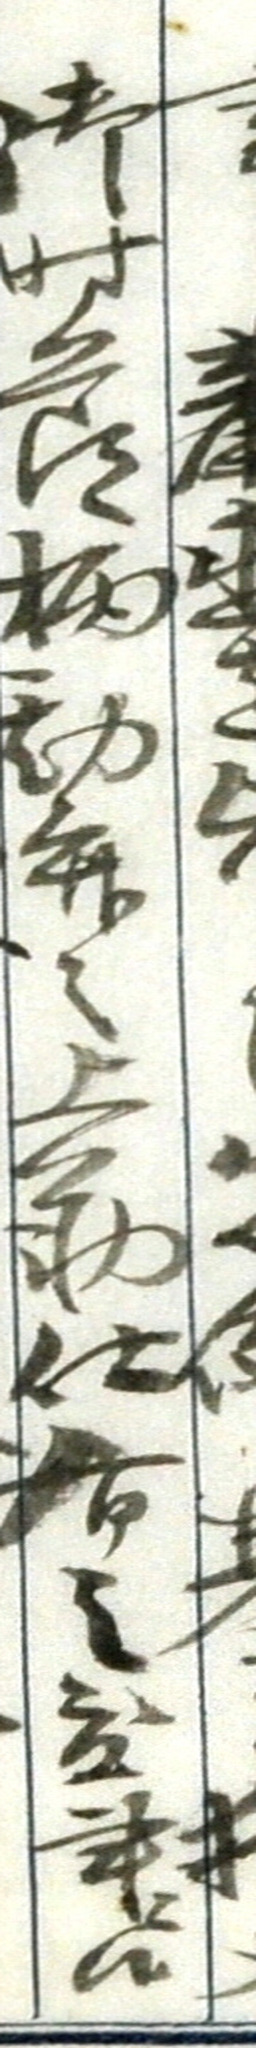御時節柄勘弁之上勤仕有之度事ニ候
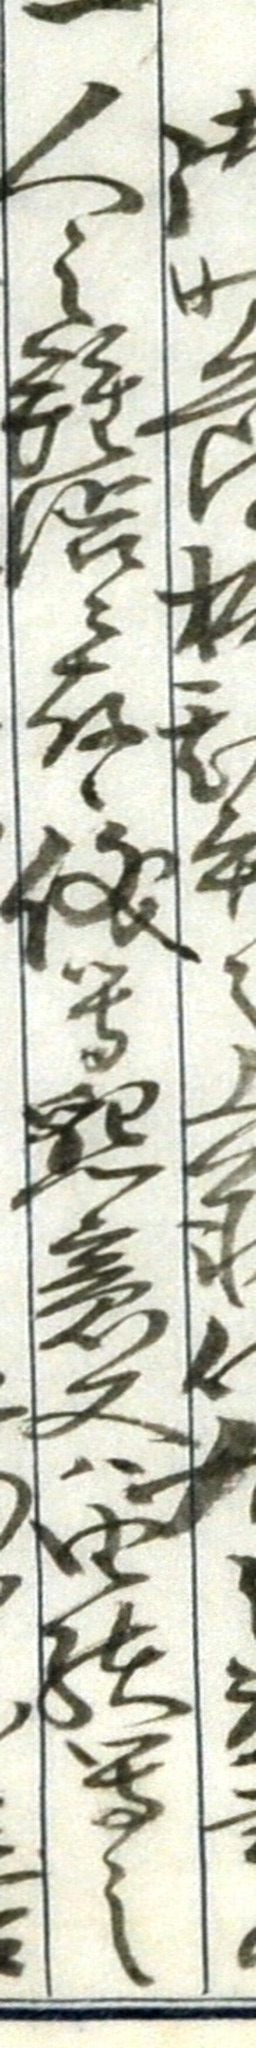一人之難渋ニ存候儀等懇意又ハ由緒等之
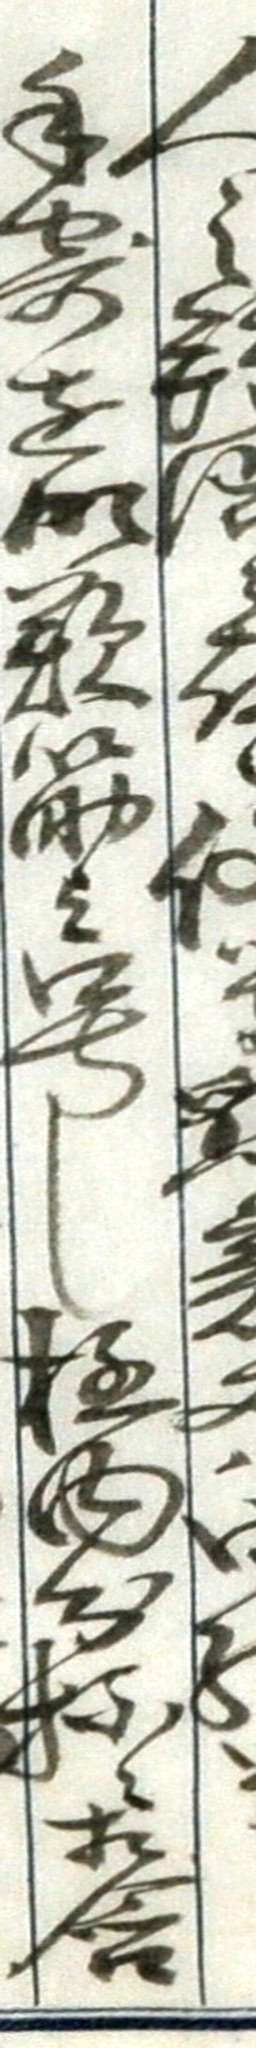年寄を以歎筋と号し極内分抔ニ相含
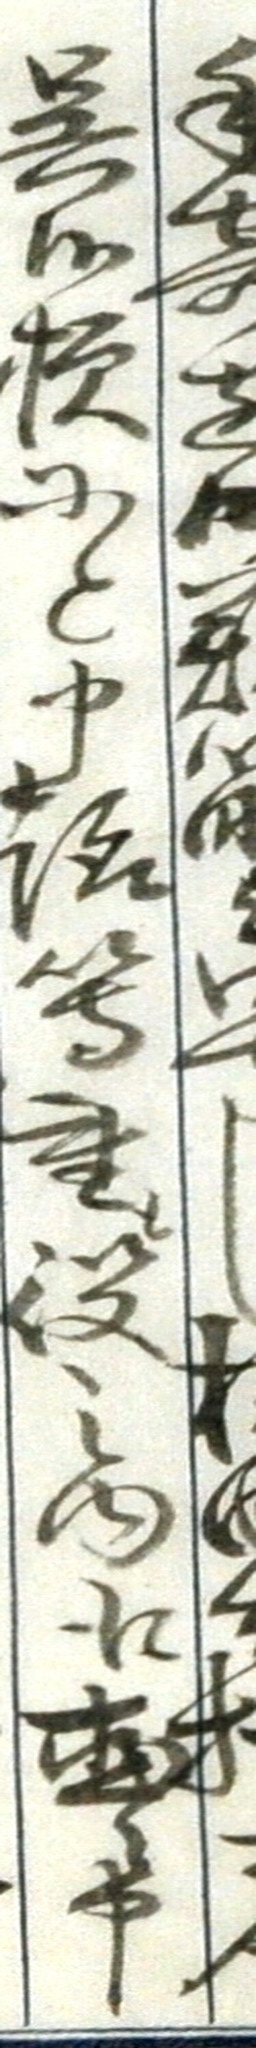呉候様にと申趣等重も役之内江直ニ申
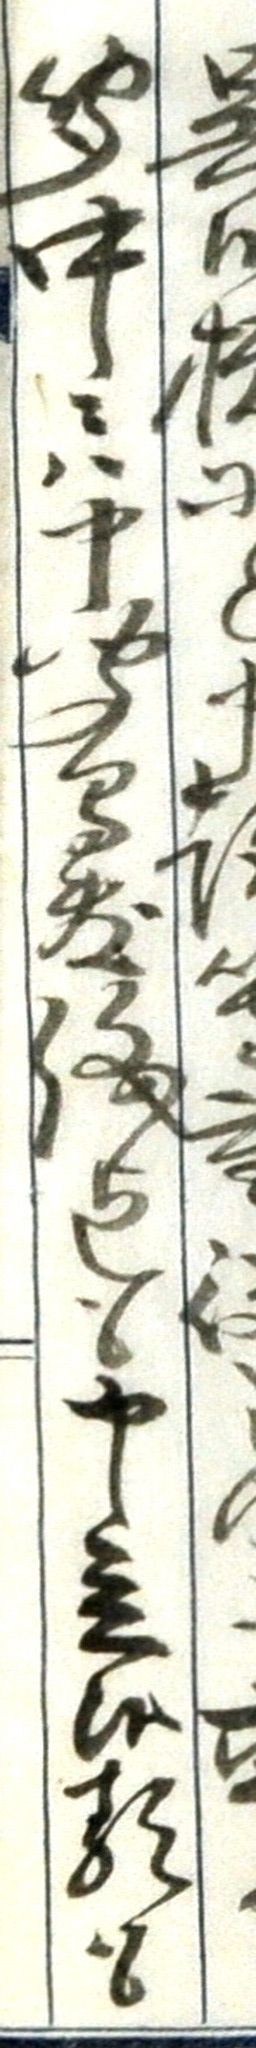聞中ニハ申聞間敷儀迄も申立候類も

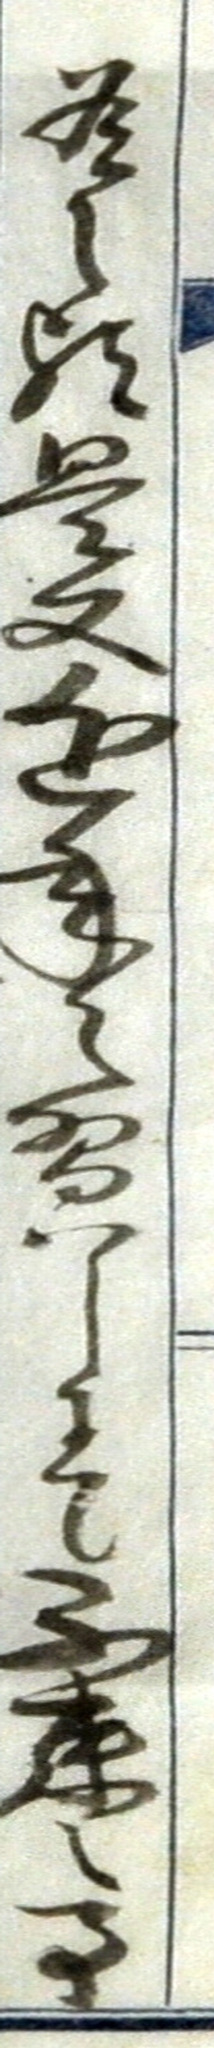有之欤是又近年之習ハしまて不束之事
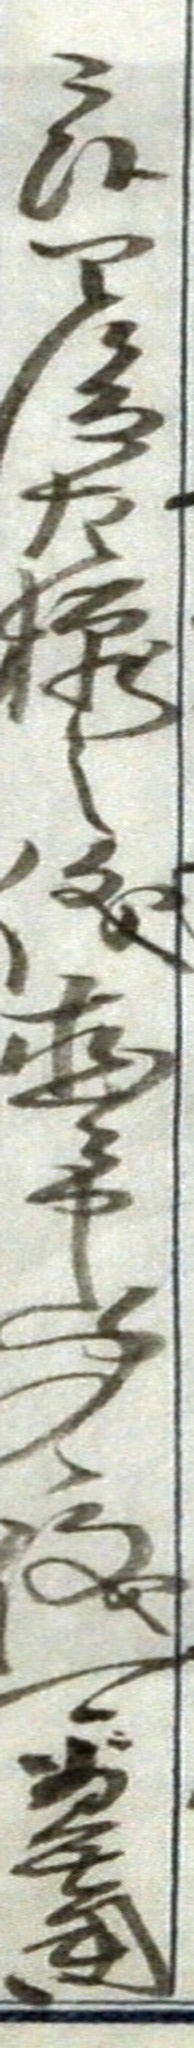ニ候已後左様之儀直ニ申聞候儀可為無用候
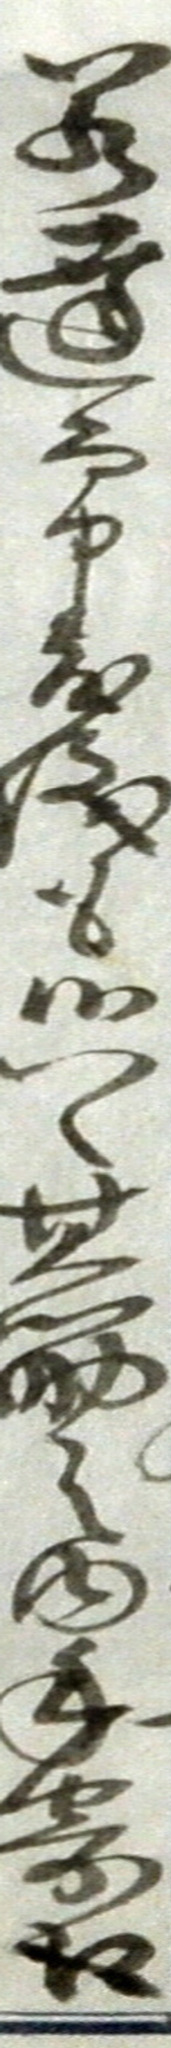若達而申度儀も候ハヽ其筋之内年寄江
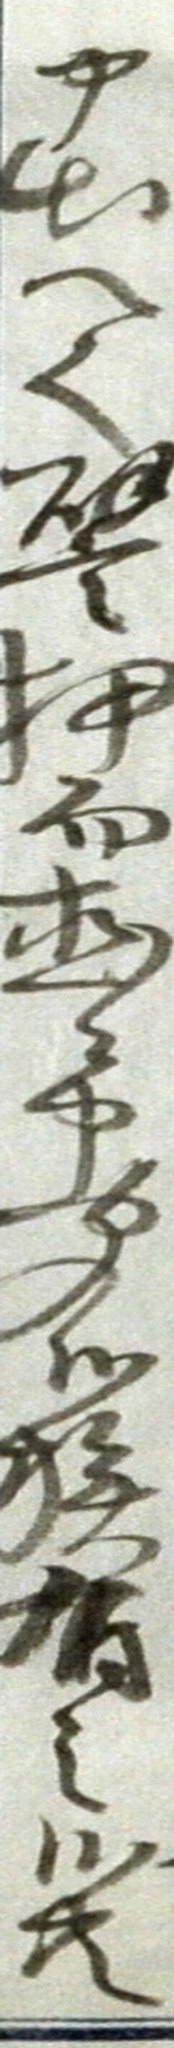申出へく譬押而直ニ申聞候族有之候共
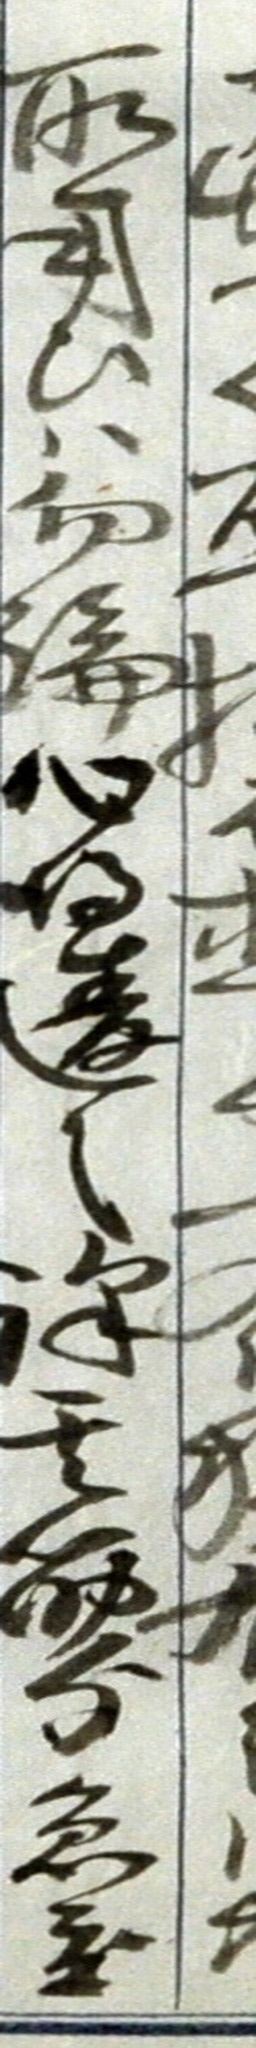取用ひハ勿論心得違之訳其筋ゟ急度
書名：御倹約被仰出書
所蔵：伊那市立高遠町図書館・合同会社AMANE
